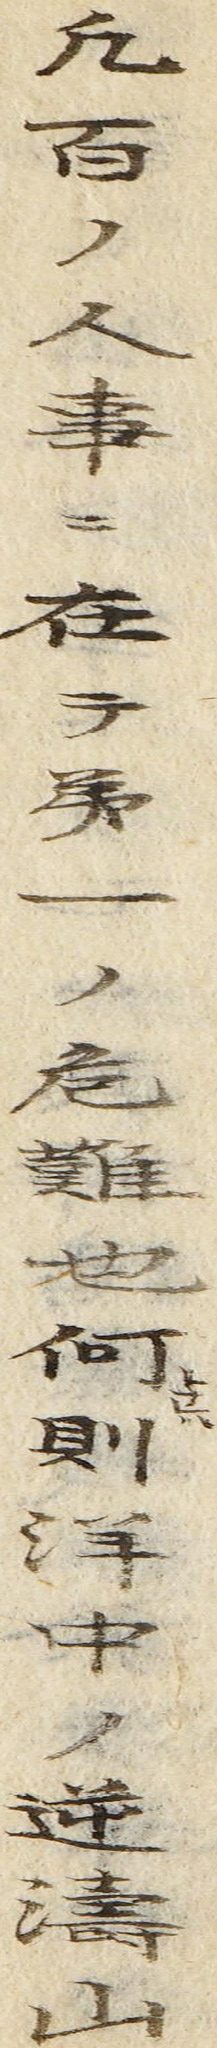凡百ノ人事ニ在テ第一ノ危難也何則洋中ノ逆濤山
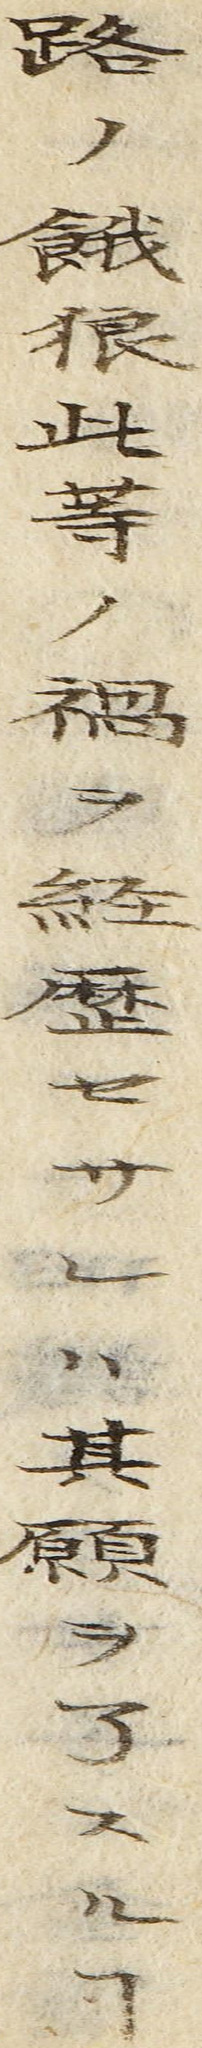路ノ餓狼此等ノ禍ヲ経歴セサレハ其願ヲ了スルコト
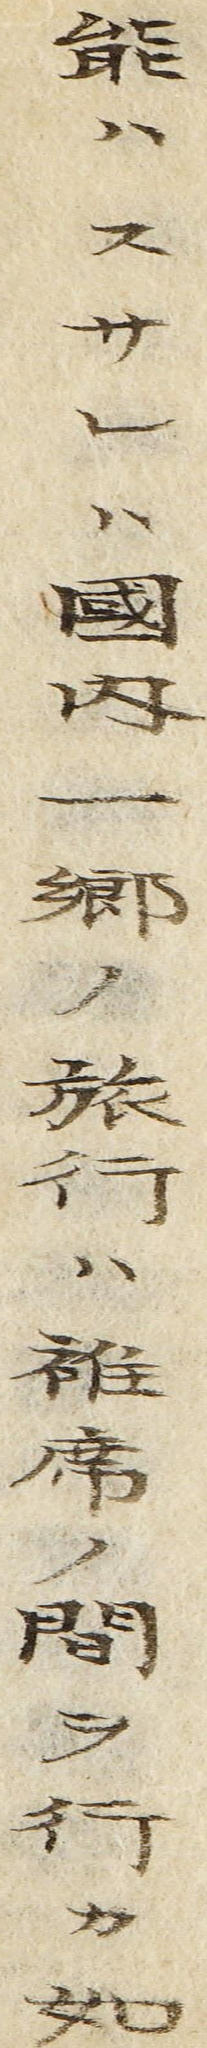能ハスサレハ国内一郷ノ旅行ハ席ノ間ヲ行カ如
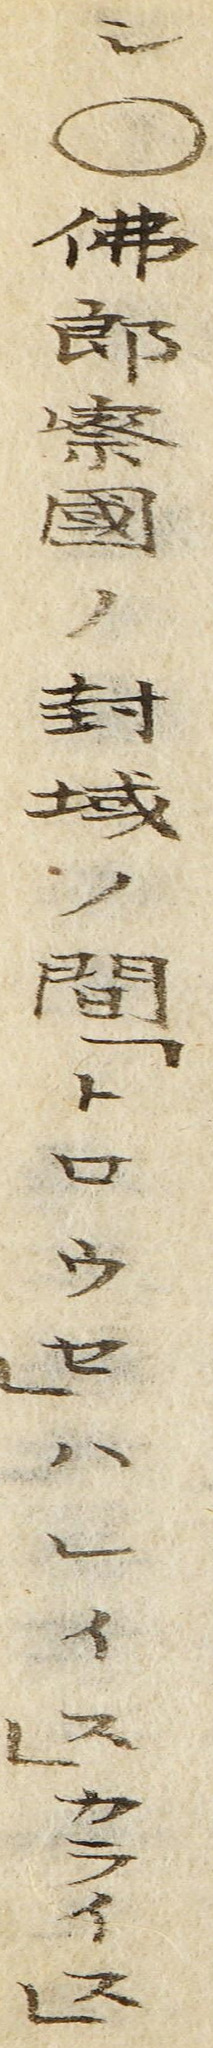シ◯仏郎察国ノ封域ノ間「トロウセ」ハレイス」カライス」

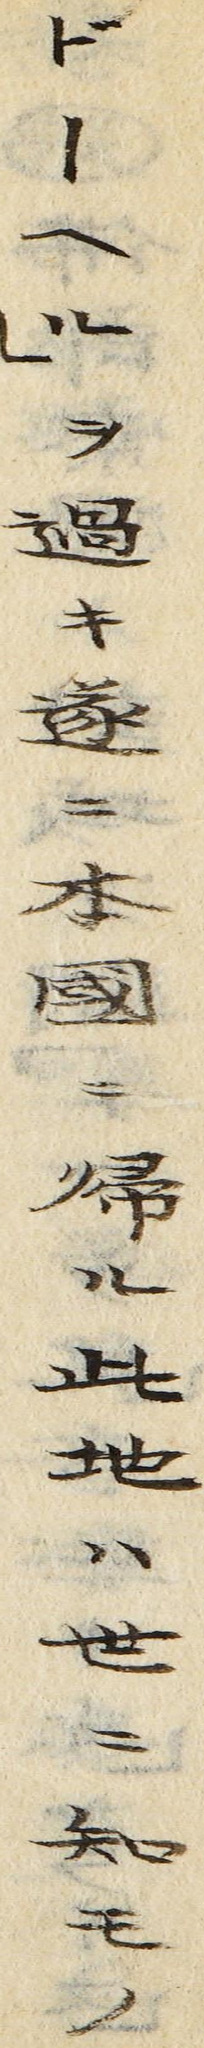ドーヘル」ヲ過キ遂ニ本国ニ帰ル此地ハ世ニ知モノ
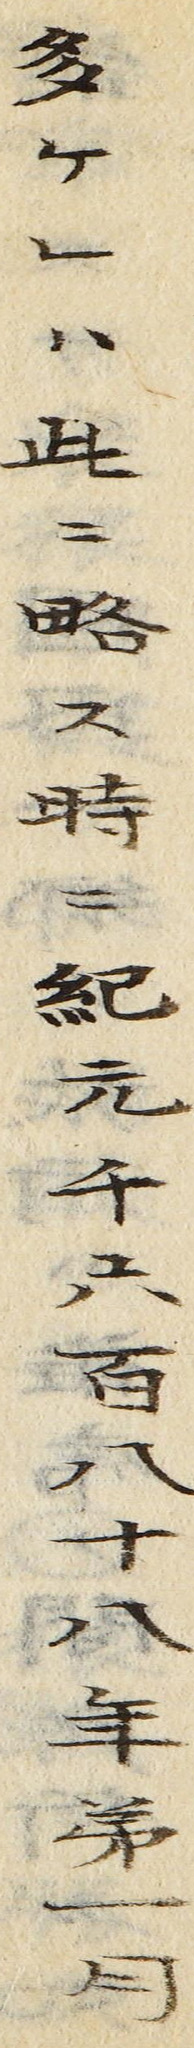多ケレハ此ニ略ス時ニ紀元千六百八十八年第一月
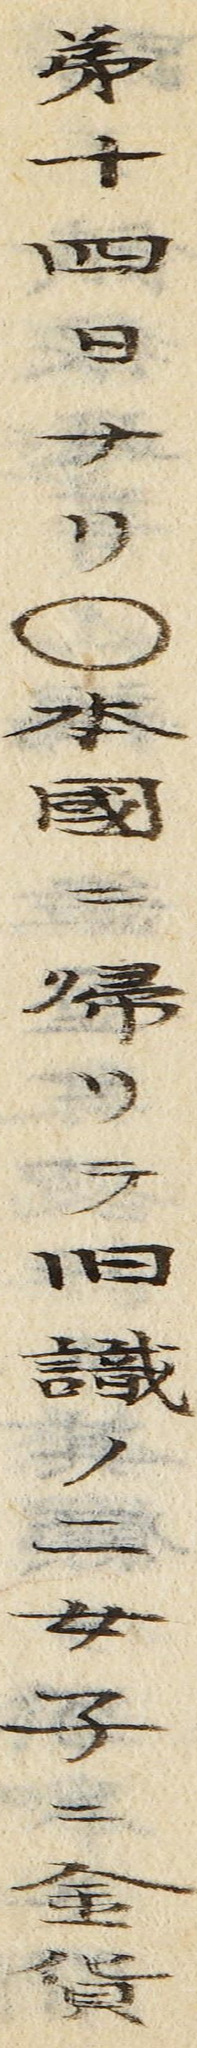第十四日ナリ◯本国ニ帰リテ旧識ノ二女子ニ金貨
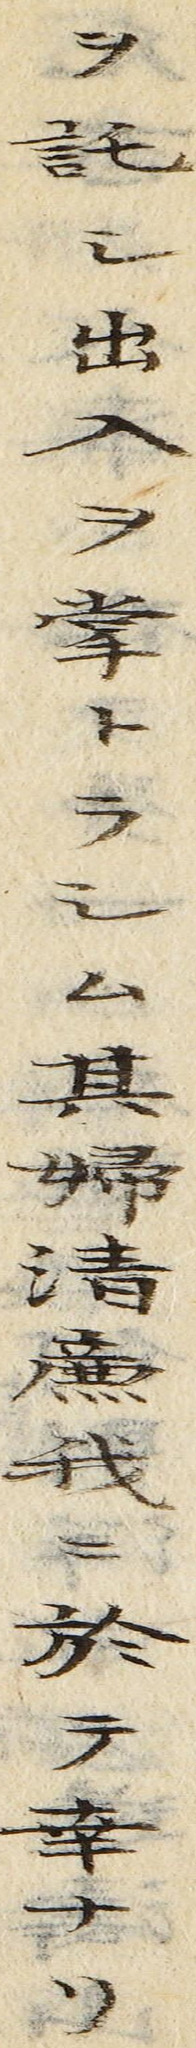ヲ託シ出入ヲ掌トラシム其婦清廉我ニ於テ幸ナリ
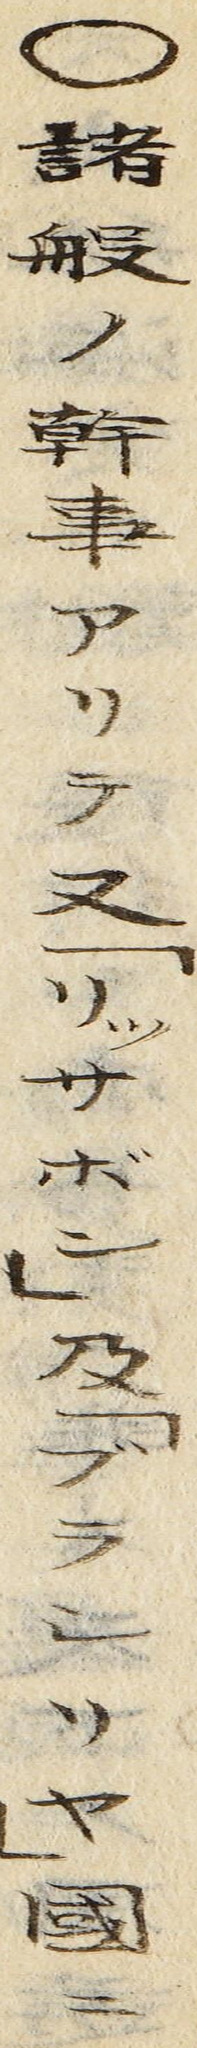◯諸般ノ幹事アリテ又「リッサボン」及「ブラシリヤ」国ニ
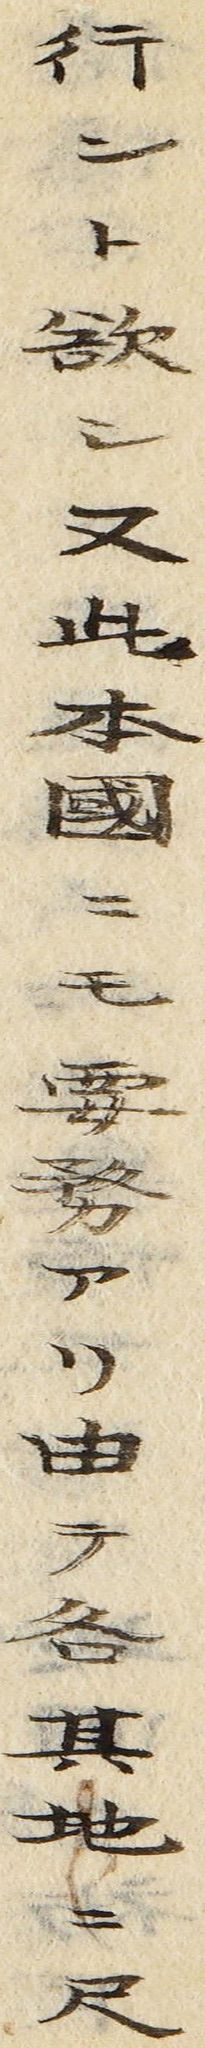行ント欲シ又此本国ニモ要務アリ由テ各其地ニ尺
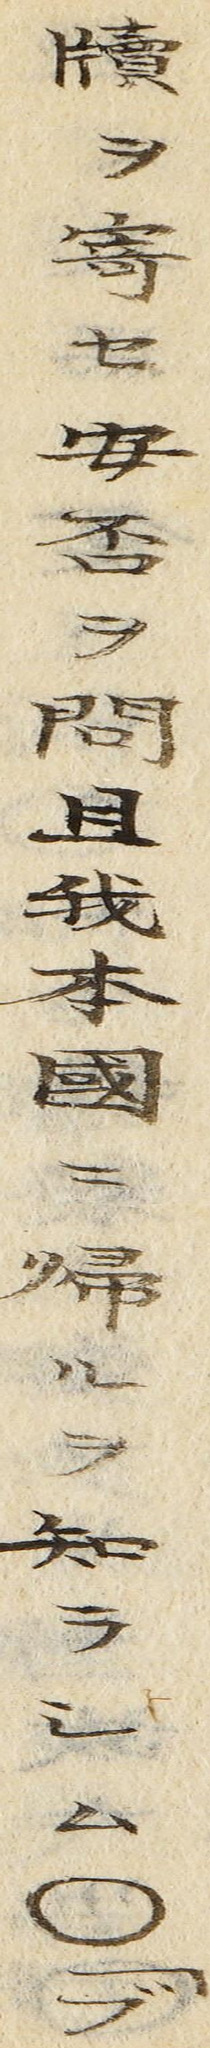牘ヲ寄セ安否ヲ問且我本国ニ帰ルヲ知ラシム◯「ブ
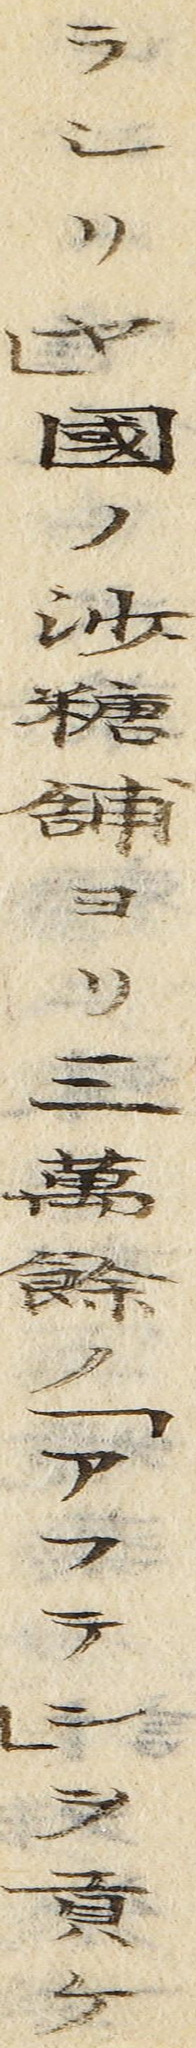ラシリヤ」国ノ沙糖舗ヨリ三万余ノ「アフテン」ヲ貢ケ
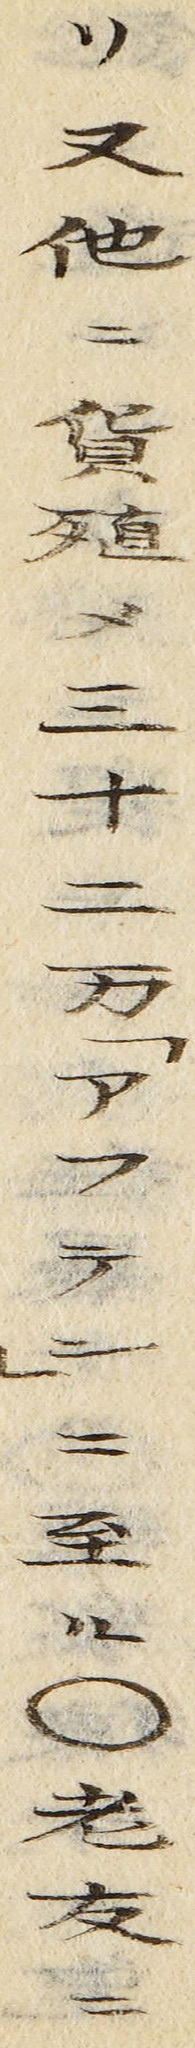リ又他ニ貨殖シテ三十二万「アフテン」ニ至ル◯老友ニ
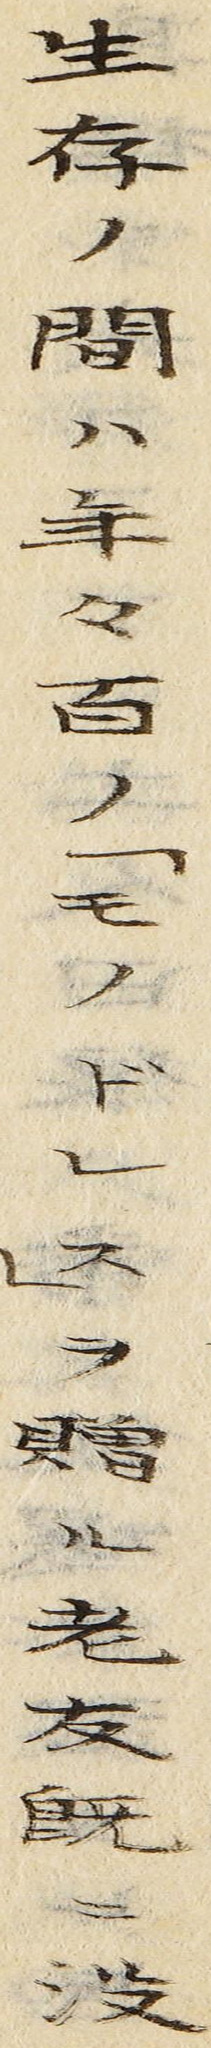生存ノ間ハ年々百ノ「モノドレス」ヲ贈ル老友既ニ没
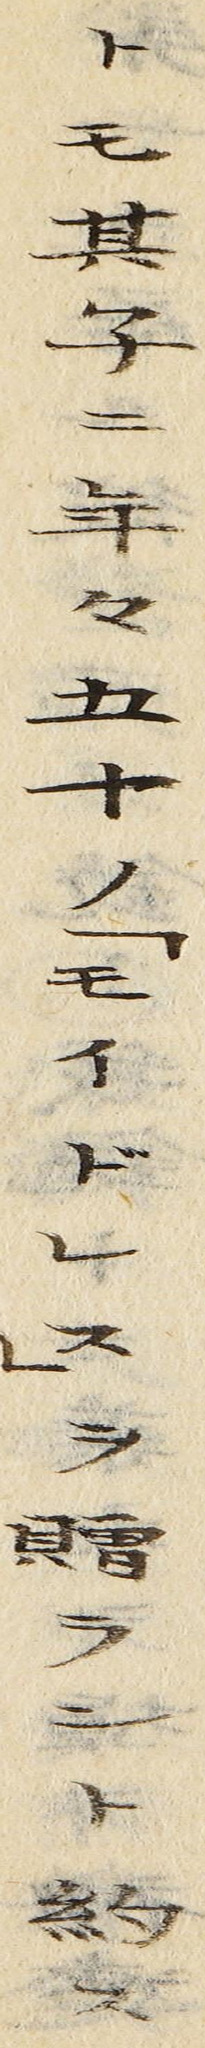トモ其子ニ年々五十ノ「モイドレス」ヲ贈ラント約ス
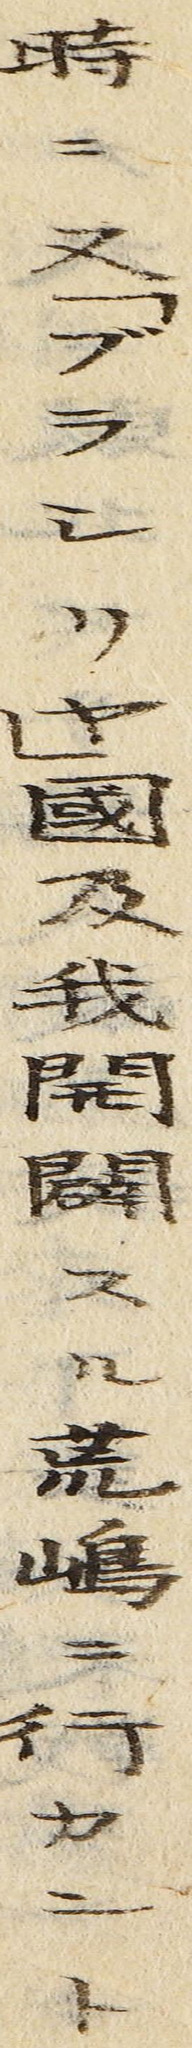時ニ又「ブラシリヤ」国及我開闢スル荒嶋ニ行カント
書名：漂流紀事
